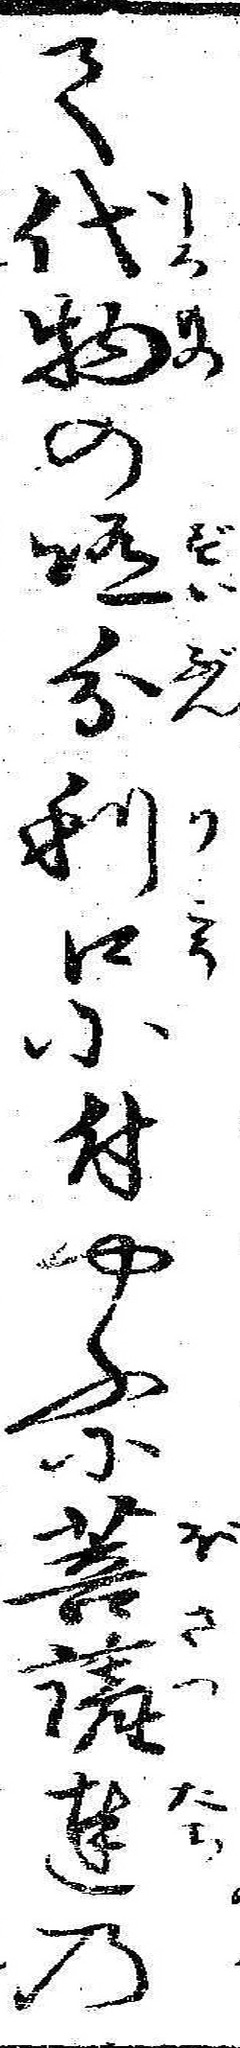て代物の随分利口に付やふに菩薩達の
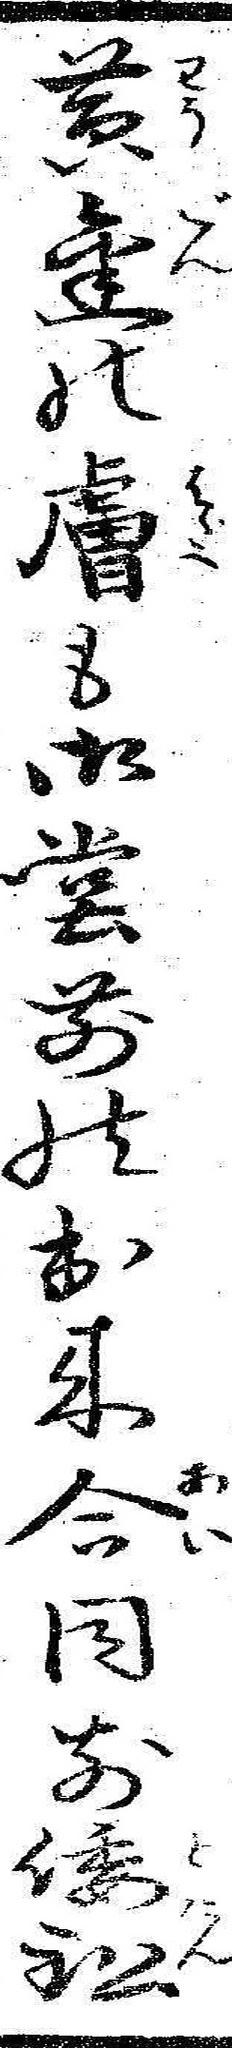黄金の膚も御堂前の出来合同前倭鉛
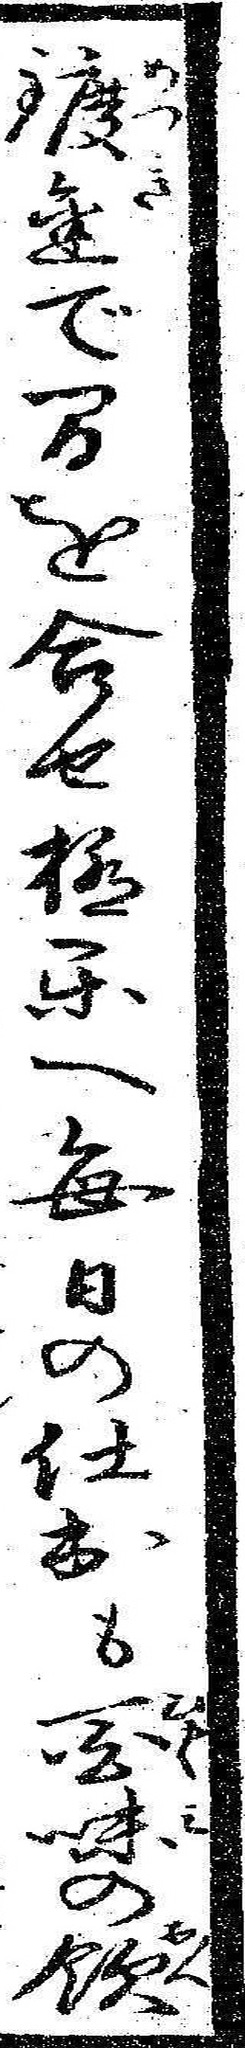鍍金で間を合せ極楽へ毎日の仕出も百味の飲
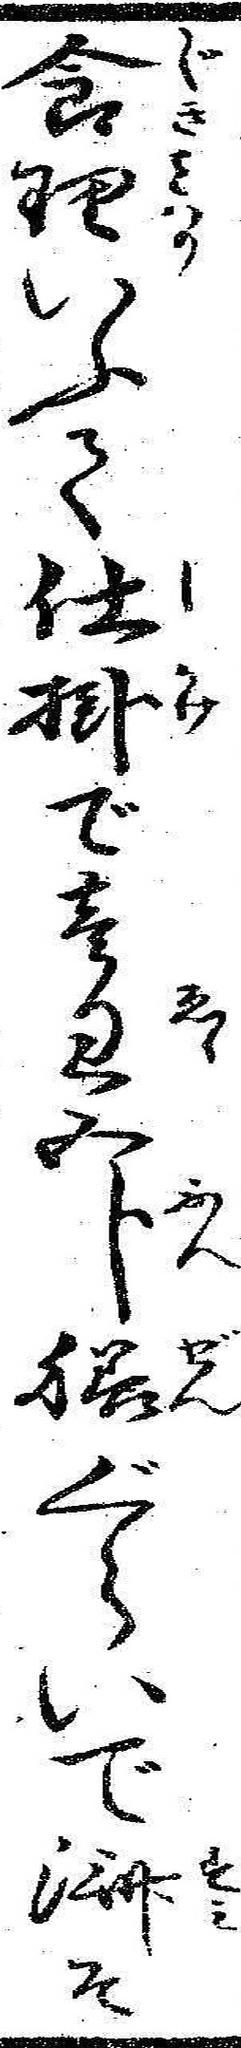食理いふて仕掛で壱匁五分膳ぐらいで済そ
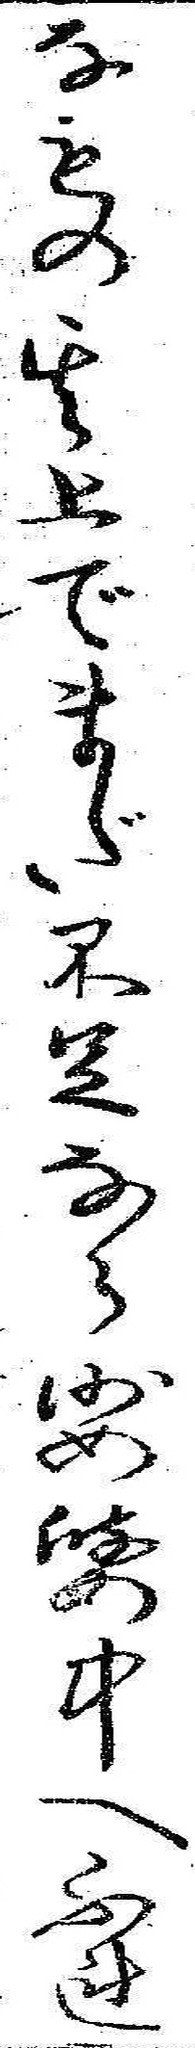なもの其上でまだ不足なら沙婆中へふれ
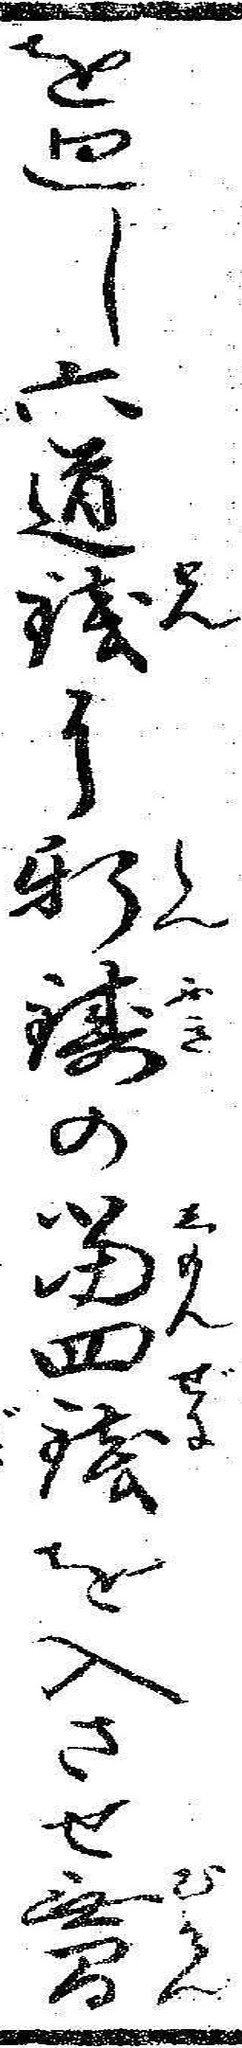を廻し六道銭に新鋳の富四銭を入させ無間
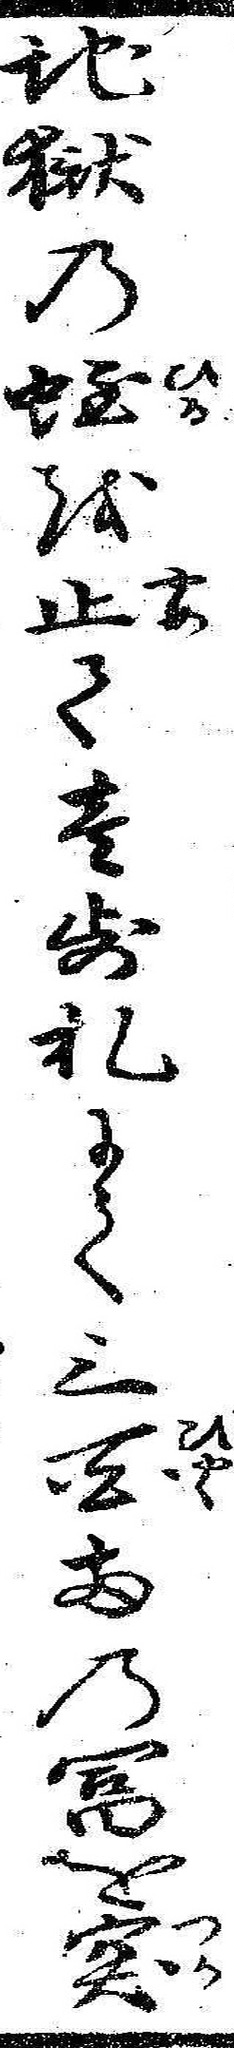地獄の蛭を止て壱歩礼にて三百両の富を突
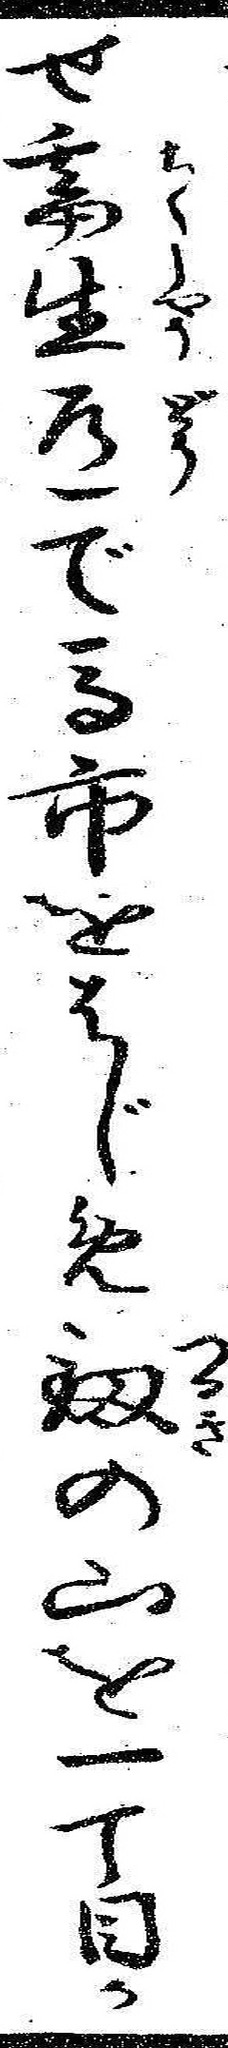せ畜生道で馬市をはじめ剣の山を一丁目か
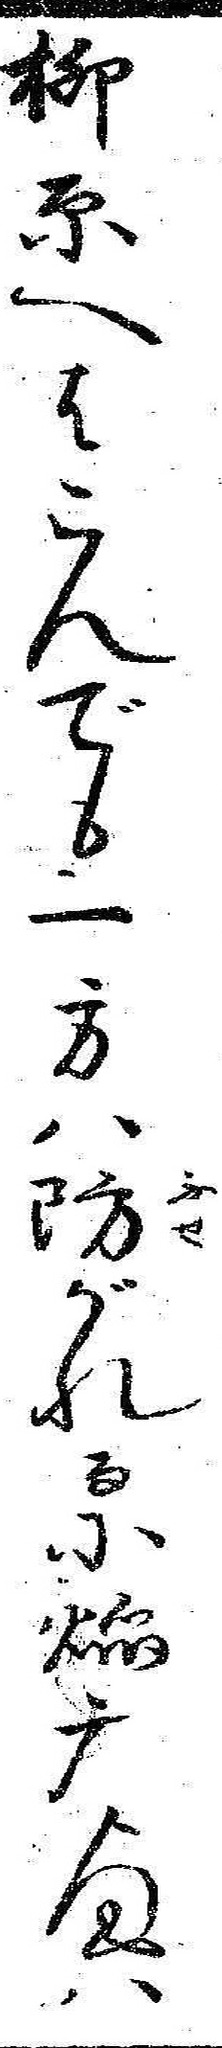柳原へはこんでも一方は防がれるに焔魔様は
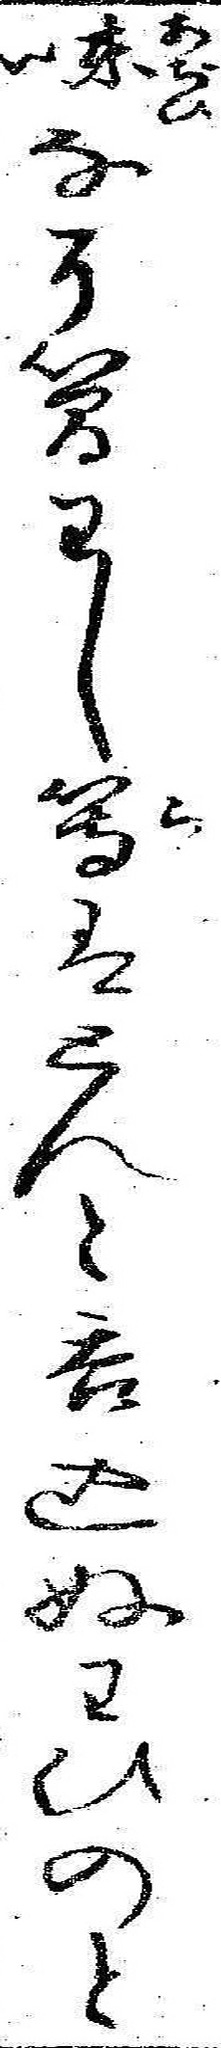味な了簡わし等はとんと呑込ぬわひのと
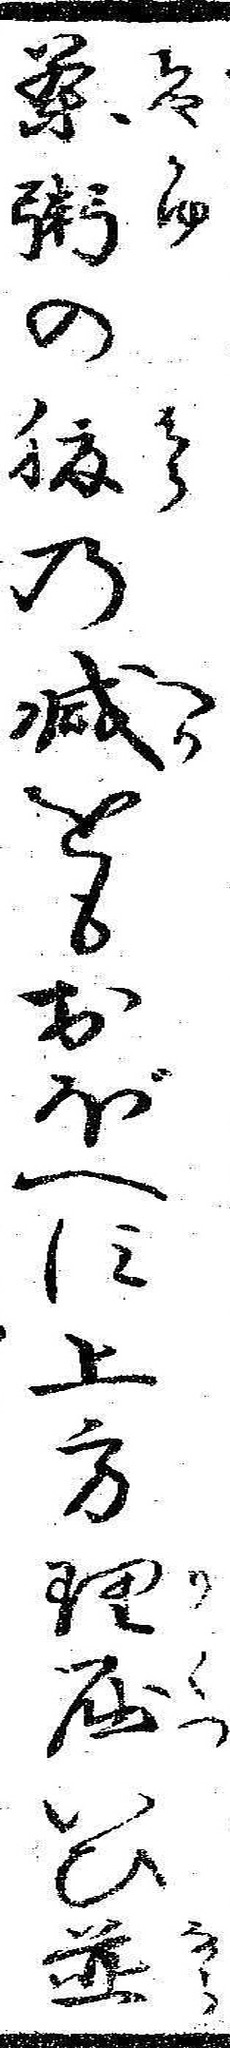茶粥の腹の減をもおぼへす上方理屈いひ並
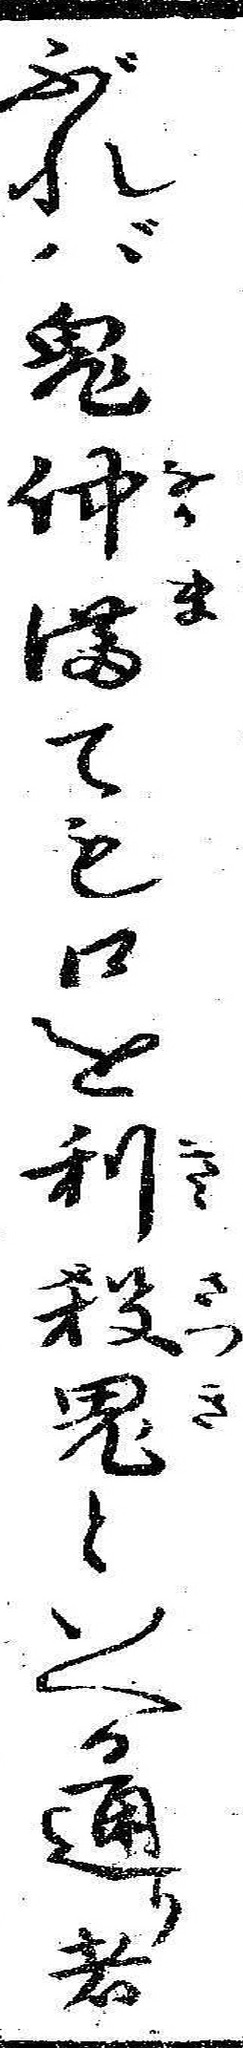ぶれば鬼仲満ても口を利殺鬼といへる通り者

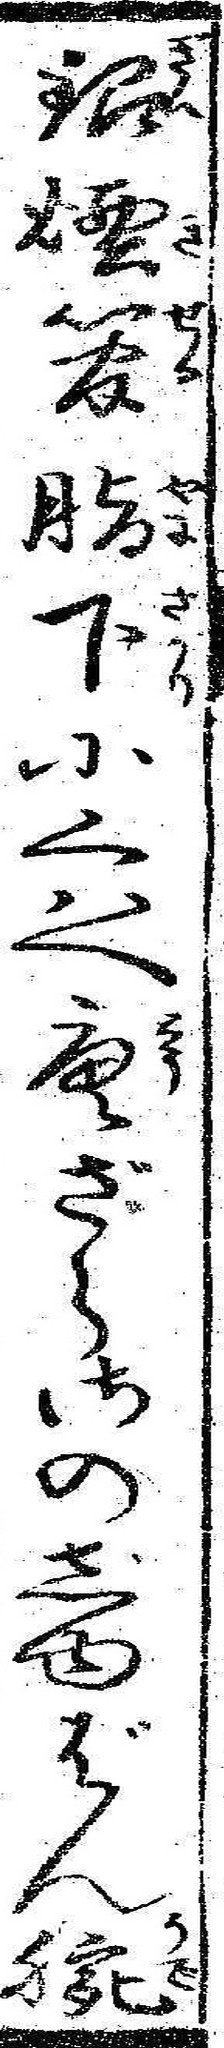銀煙管脂下にくはへ唐ざらさのじゆばん腕
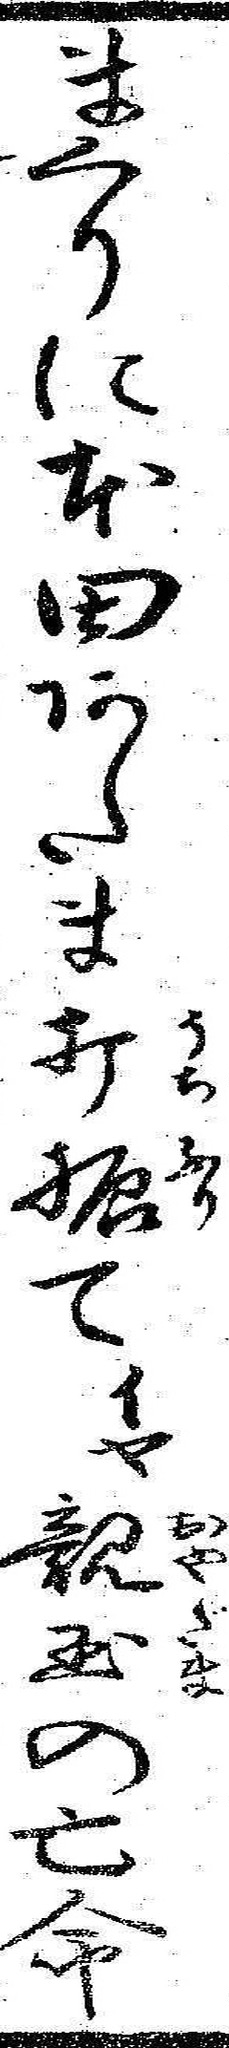まくりに本田あたま打振て親玉の亡命
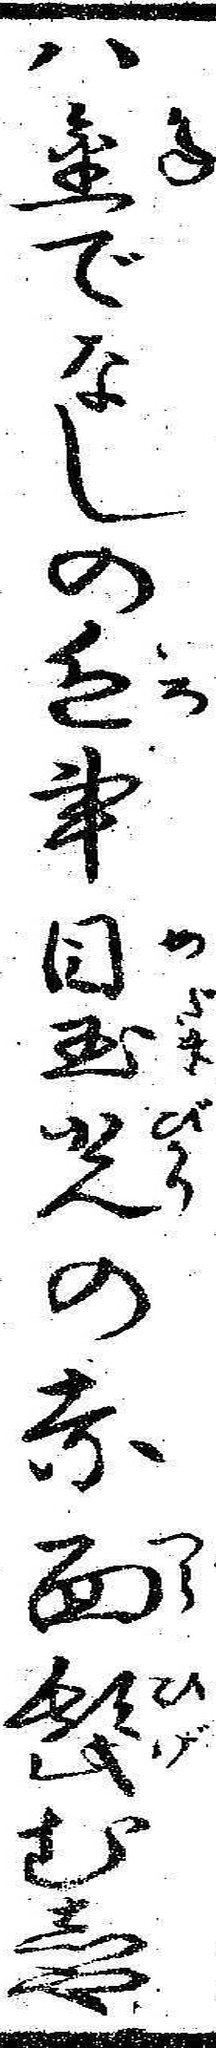は金でなしの色事目玉光の赤面髪むしや
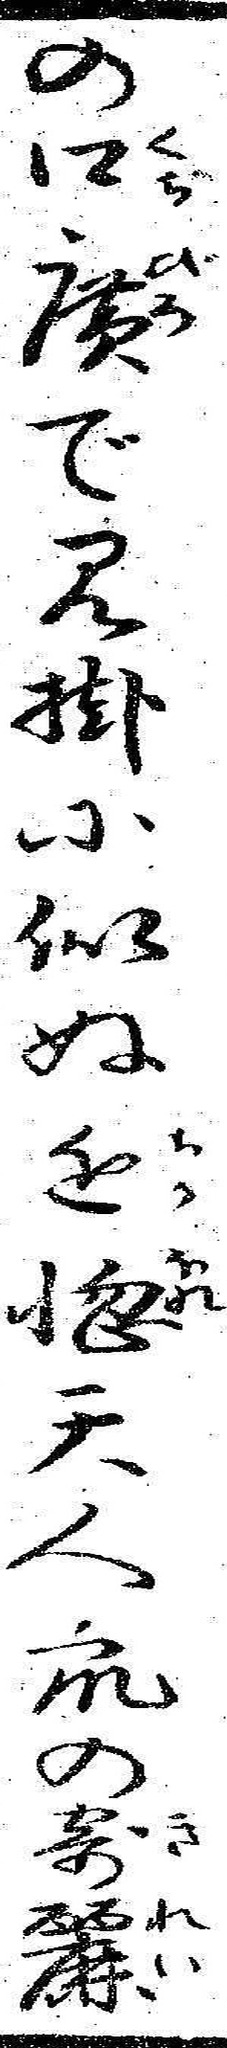の口広で見掛に似ぬ近惚天人衆の奇麗
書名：根無草後編
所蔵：国文学研究資料館
